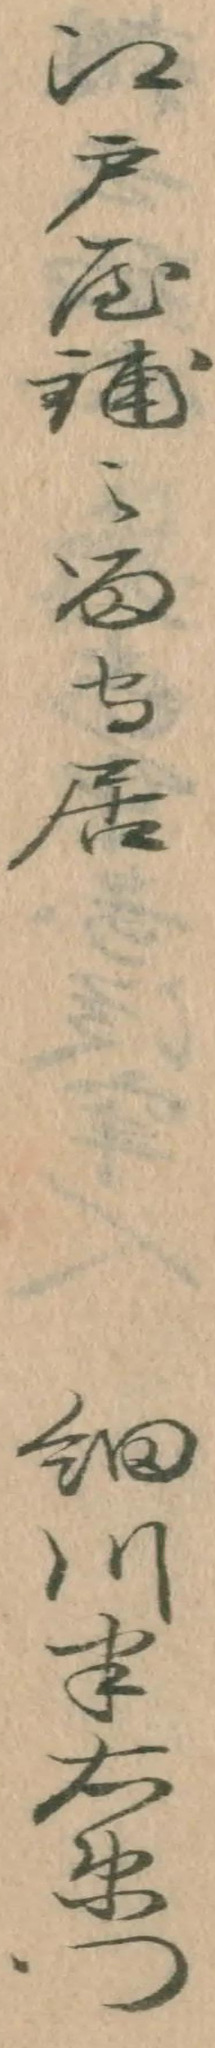江戸屋鋪之留守居細川半右衛門
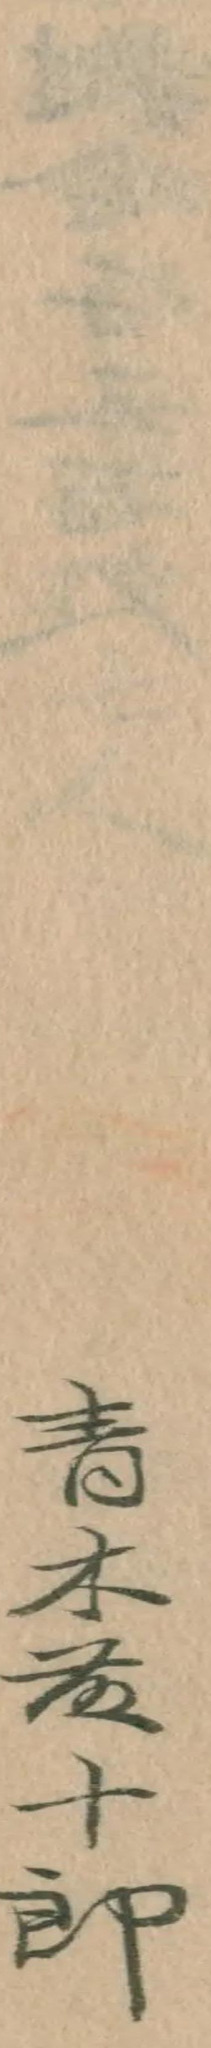青木藤十郎
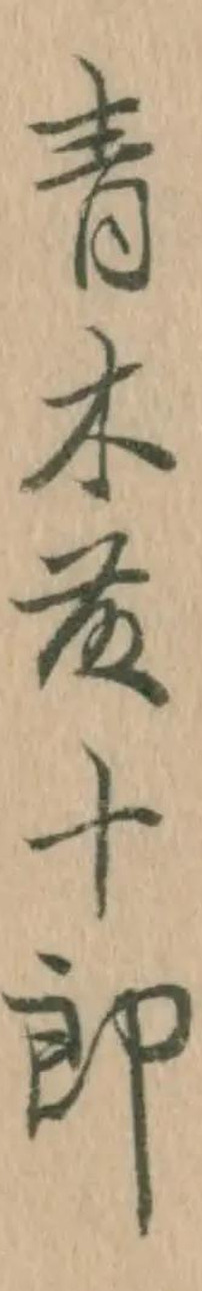青木藤十郎
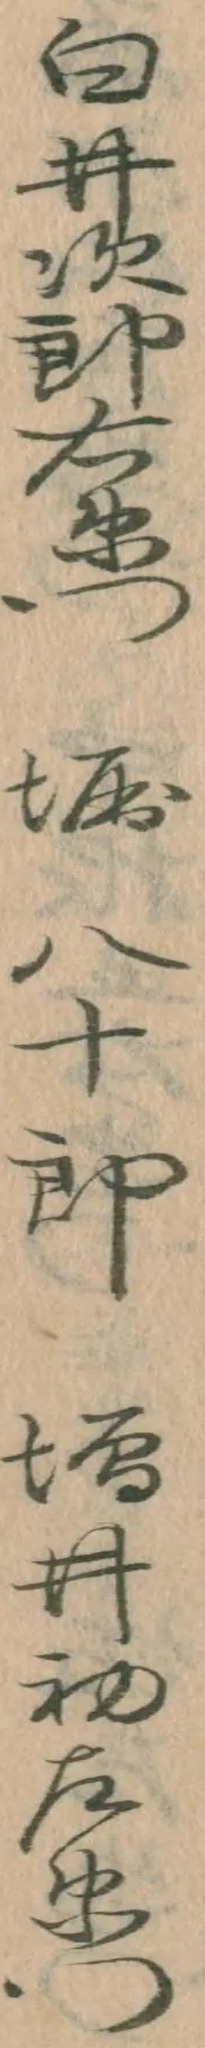白井次郎右衛門掘八十郎増井初左衛門
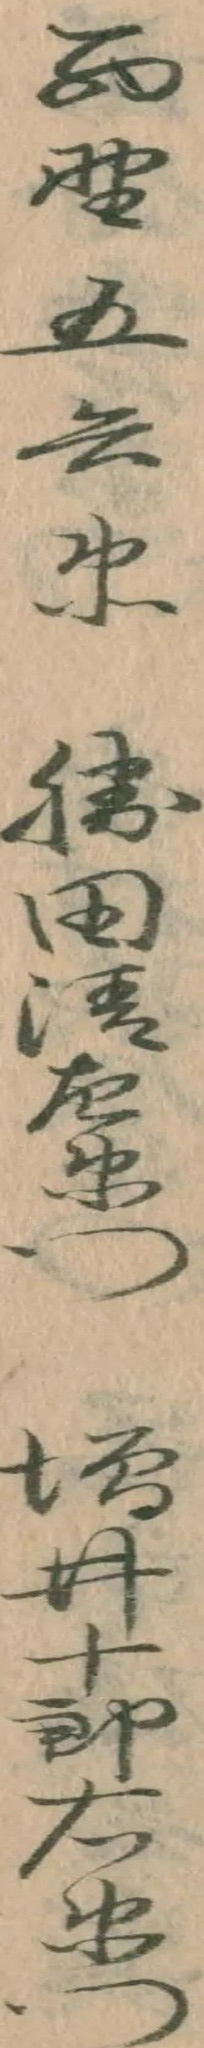西野五兵衛勝田清左衛門増井十郎右衛門
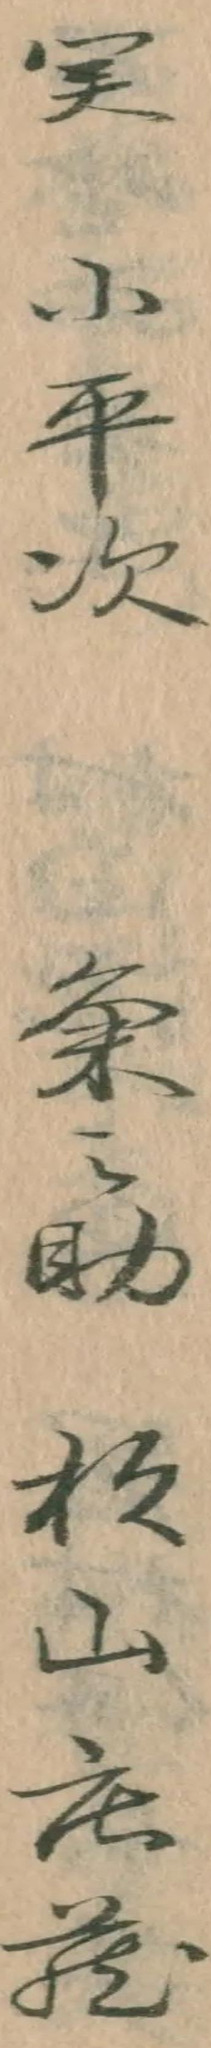関小兵次粂之助杉山庄蔵
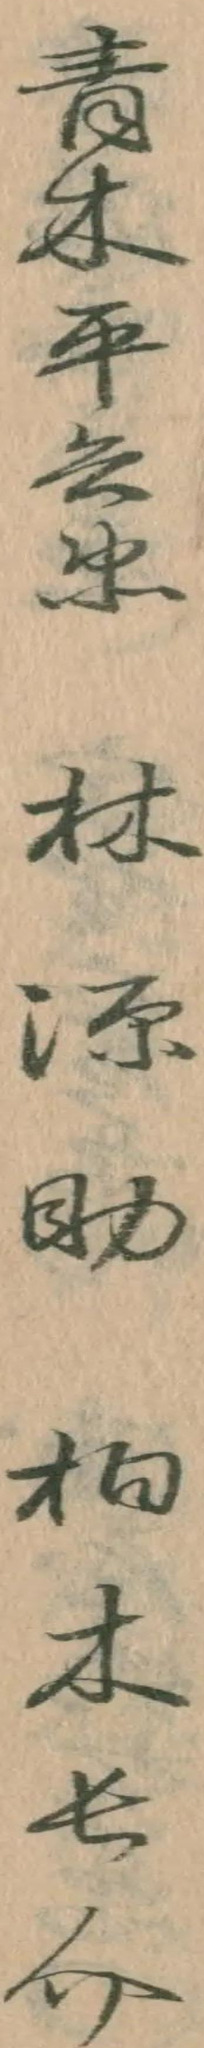青木平兵衛林源助柏木長介
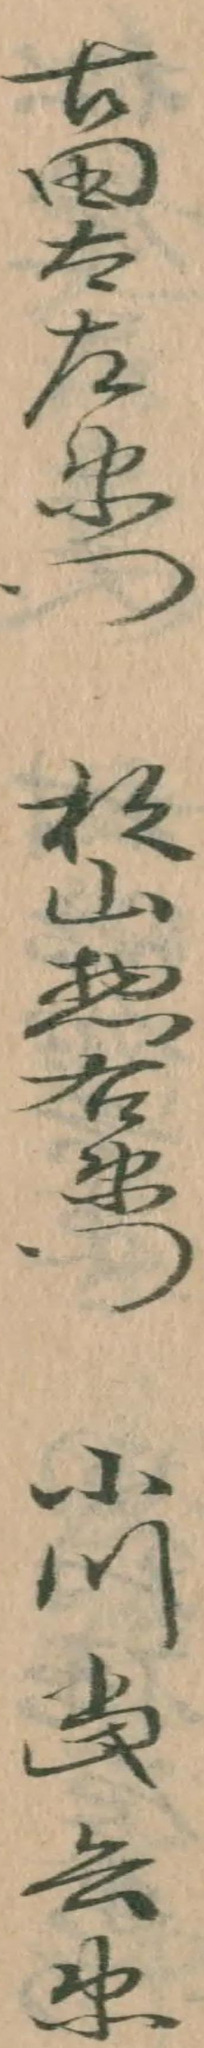古田太左衛門杉山惣右衛門小川当兵衛
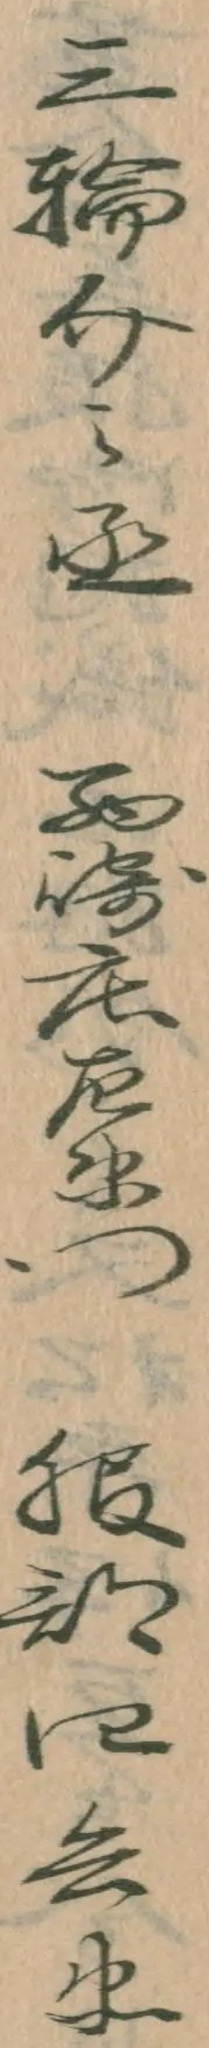三輪介之丞西崎庄左衛門服部四兵衛
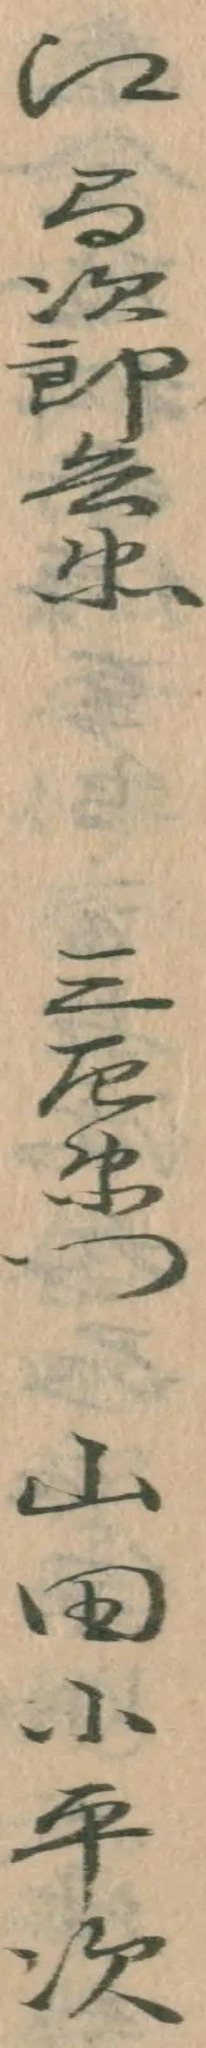江間次郎兵衛三左衛門山田小平次
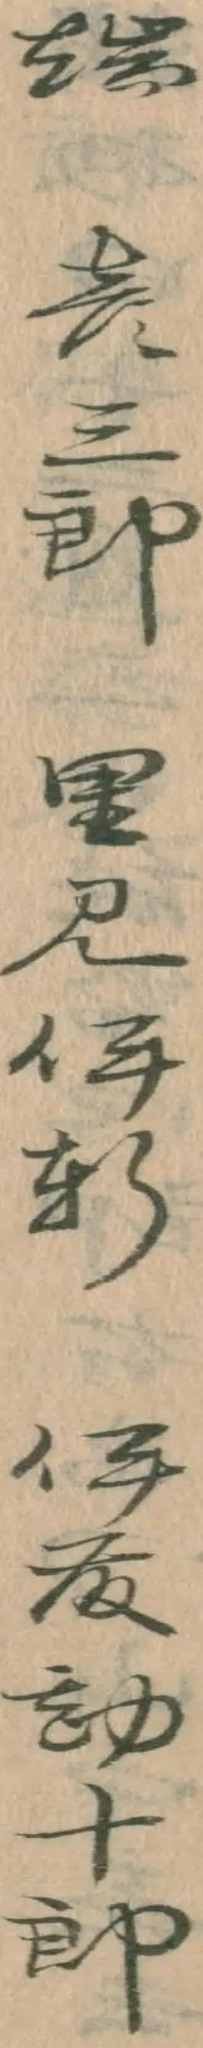端彦三郎里見伊軒伊藤勘十郎
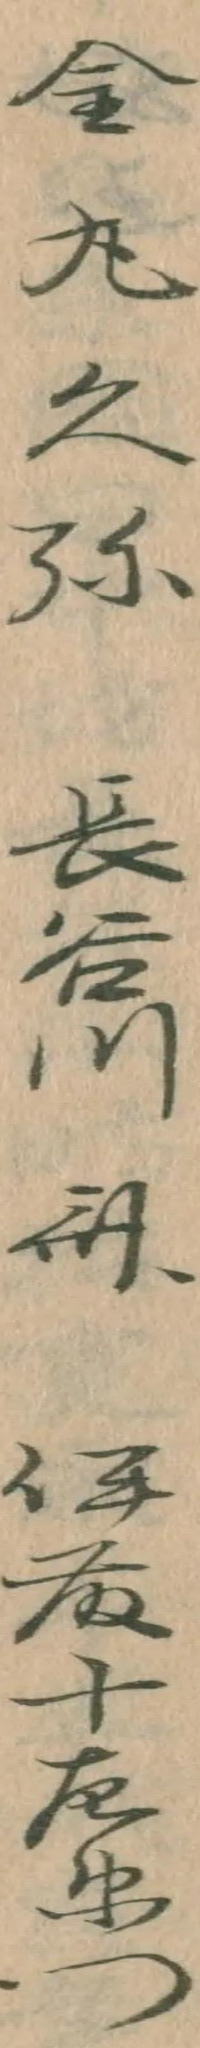金丸久弥長谷川斎伊藤十左衛門
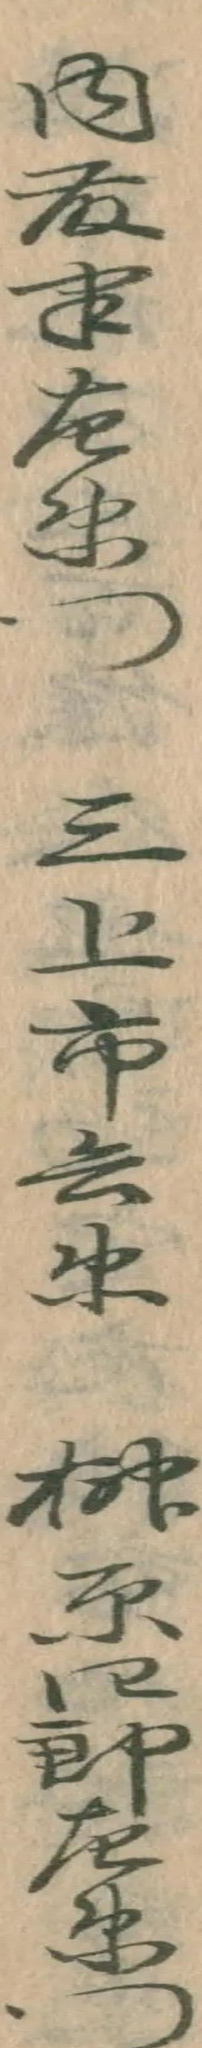内藤半左衛門三上市兵衛榊原四郎左衛門
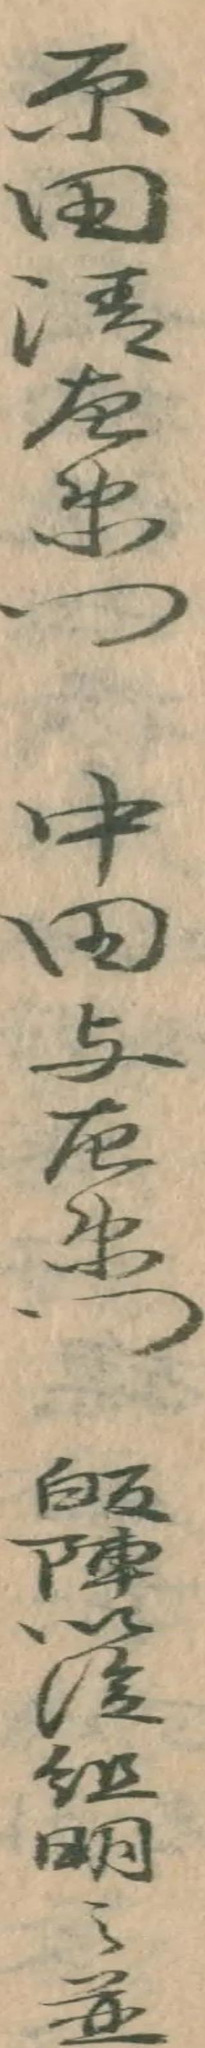原田清左衛門中田与左衛門帰陣以後組明之並
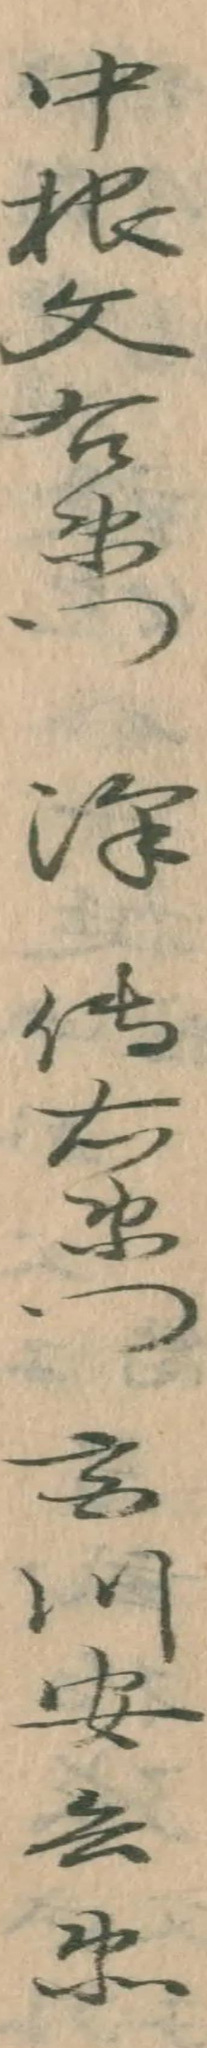中根文右衛門沢伝右衛門宮川安兵衛
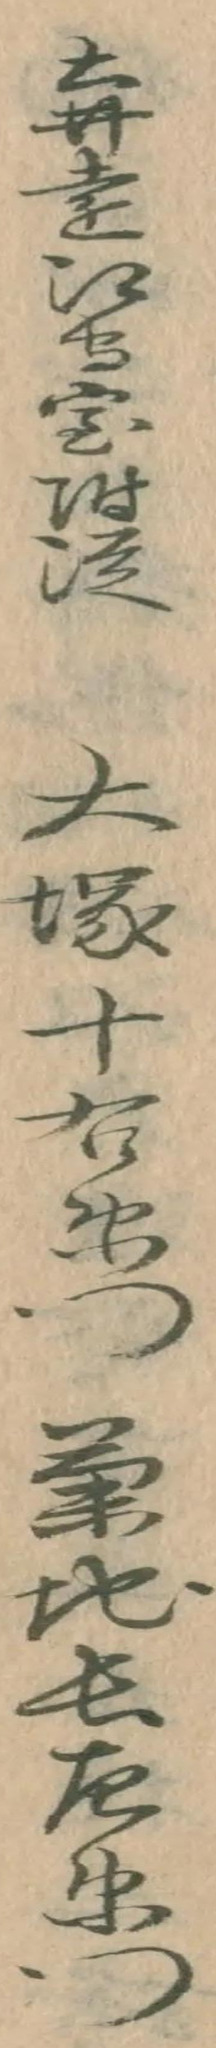土井遠江守室附従大塚十右衛門菊地長左衛門
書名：切支丹御退治記 49巻. [3]
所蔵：国立国会図書館 National Diet Library, JAPAN
